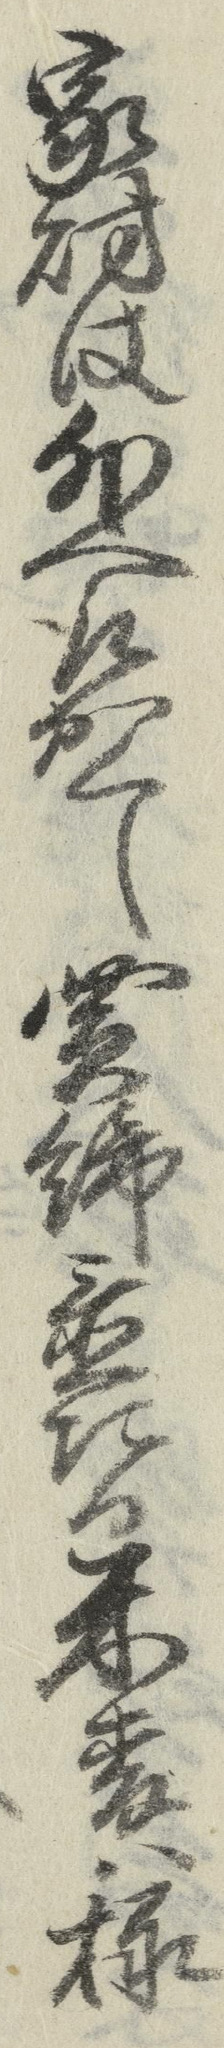家財は外へ取かくし買締置たる米麦は縁
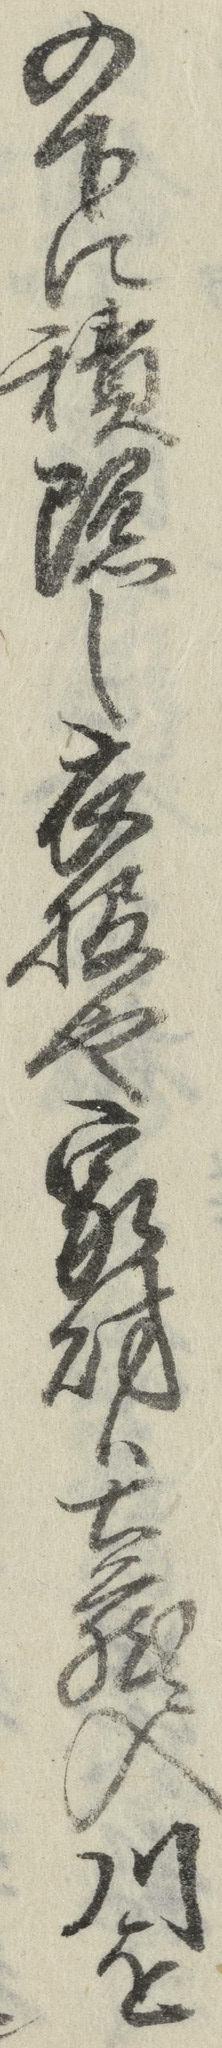の下に積隠し衣服や家財は土蔵に入川を
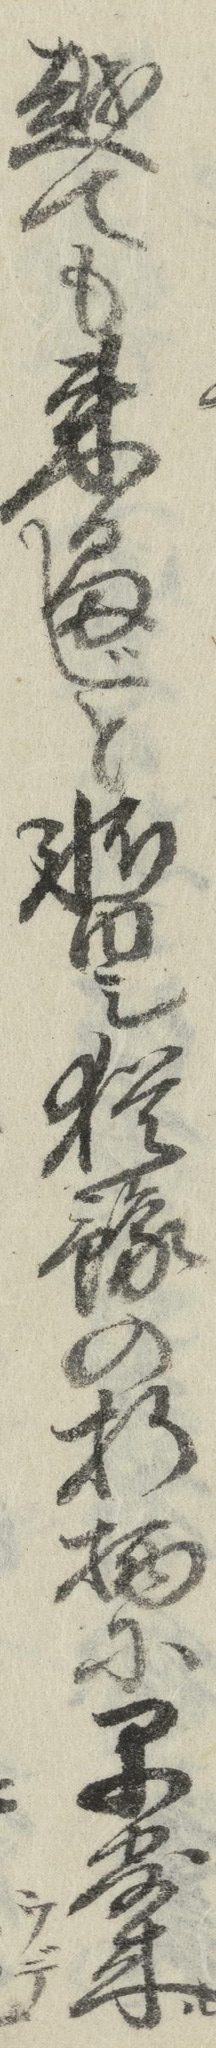越ても来るまじと暫シ猶豫の折柄に早寄来
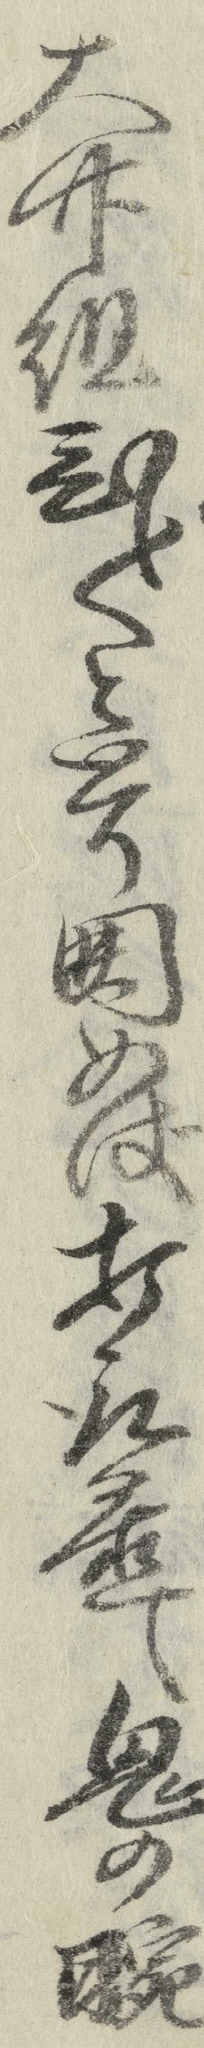大竹組ひし〳〵ととり囲めば打取置て鬼の腕
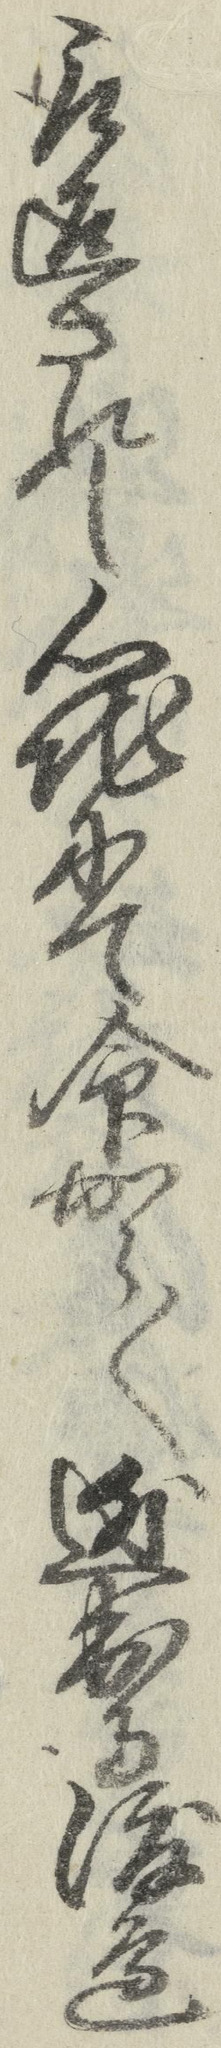取返されし心地にて命から〳〵迯出る渡辺
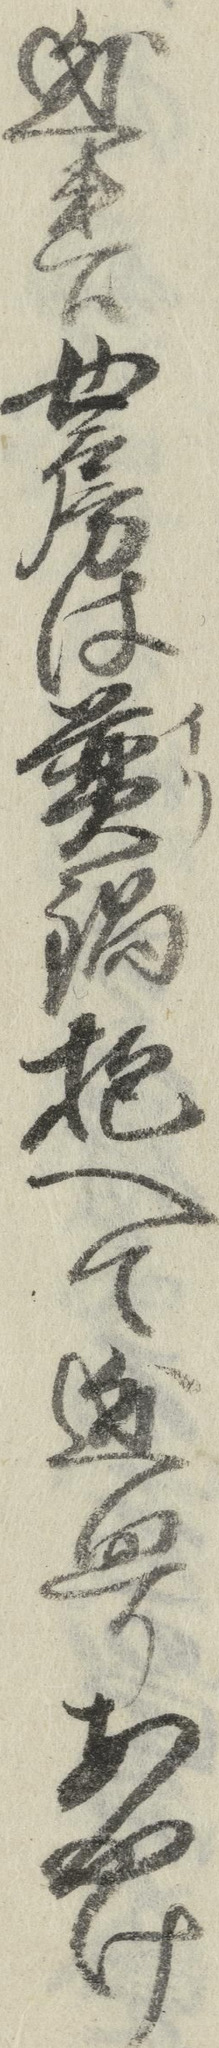迯れは女房は煎鍋抱へて迯廻りあやけ
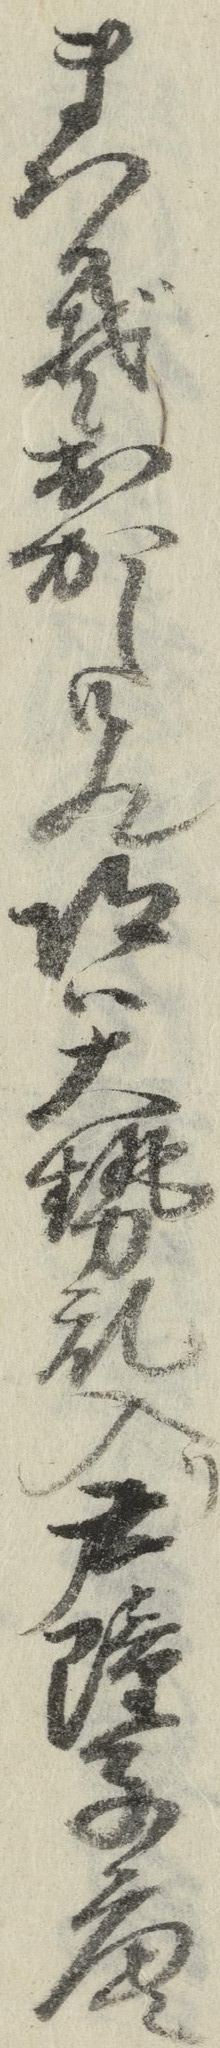まはるぞおかしけれ跡は大勢乱入戸障子唐
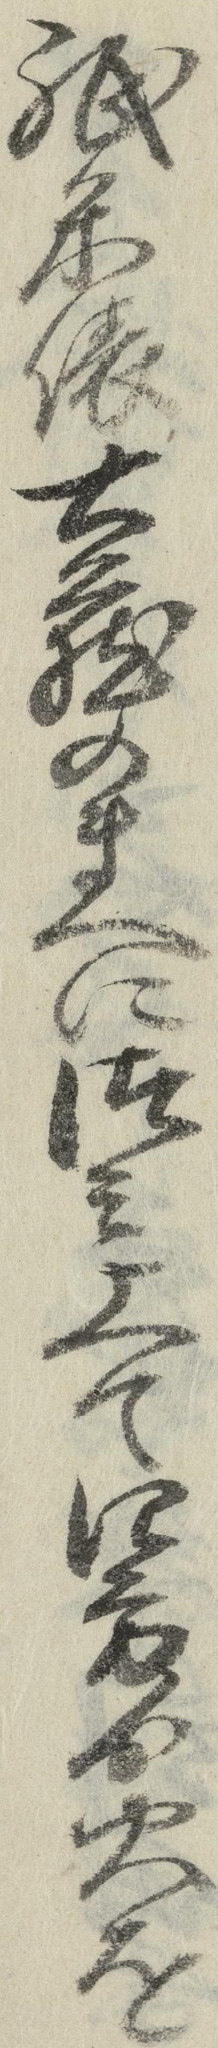紙米俵土蔵のまへにつみ上て四方ゟ火を

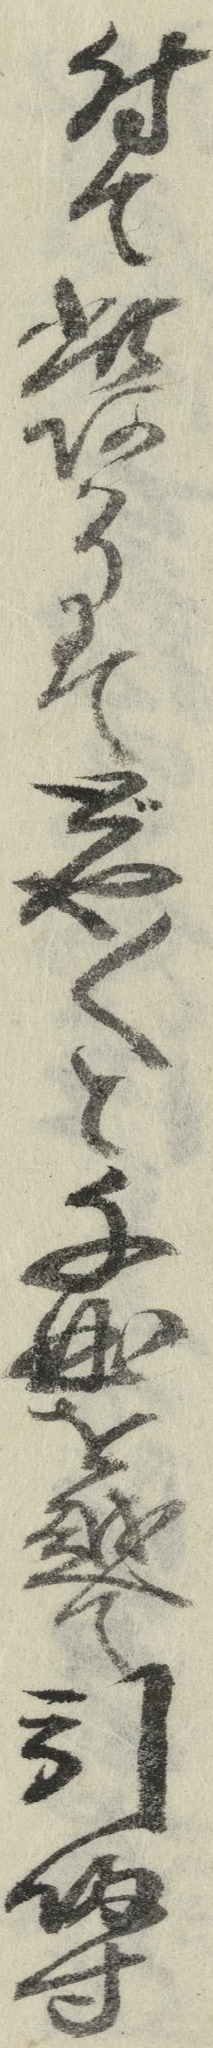付て此あかりにてどや〳〵と千曲を越て引帰す
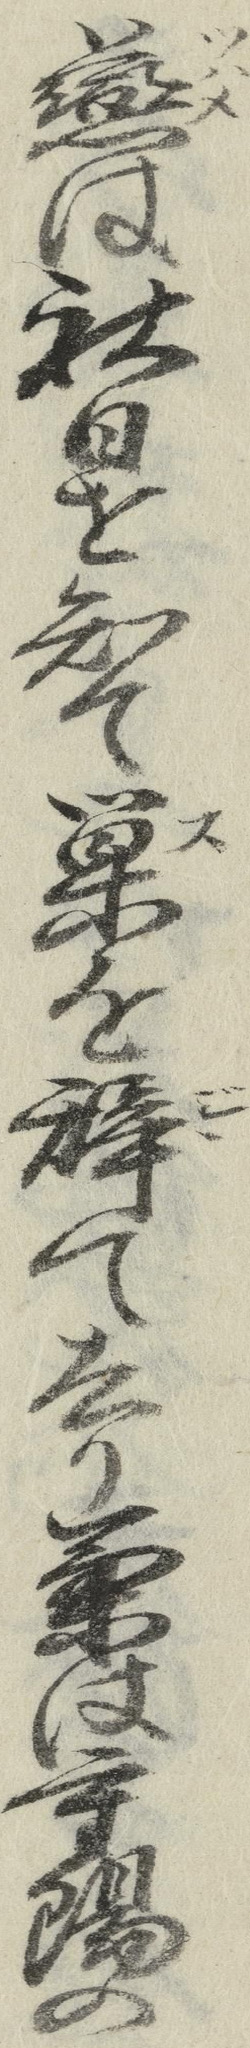燕は秋日を知て巣を辞て去り菊は重陽の
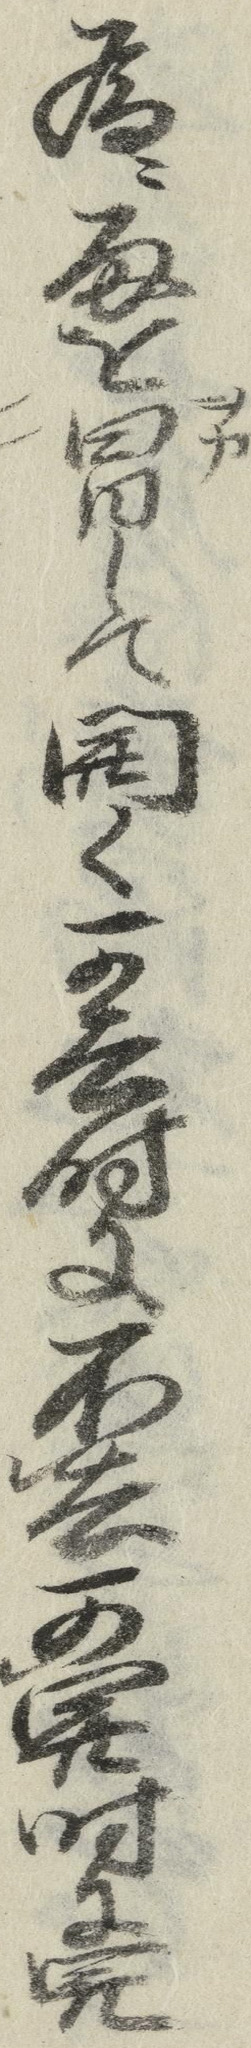為に雨を冒して開く可去時に不去可開時に開
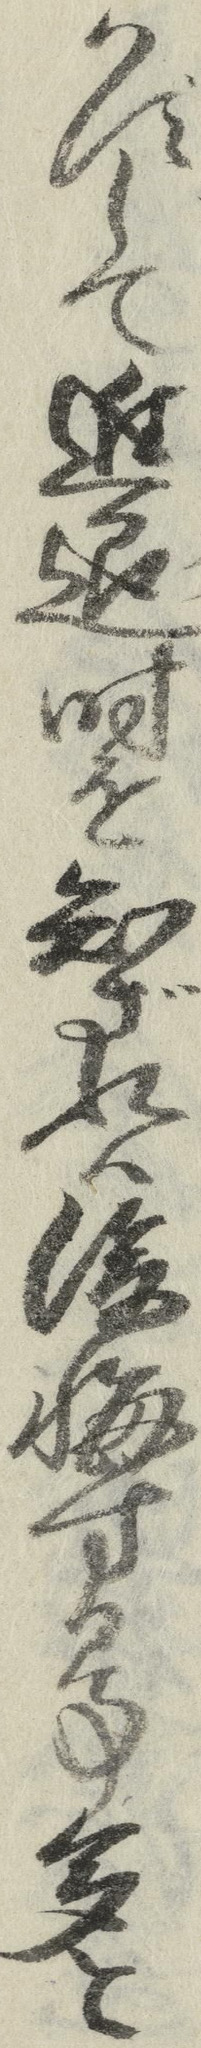かずして進退時を知ざれは後悔する事多と
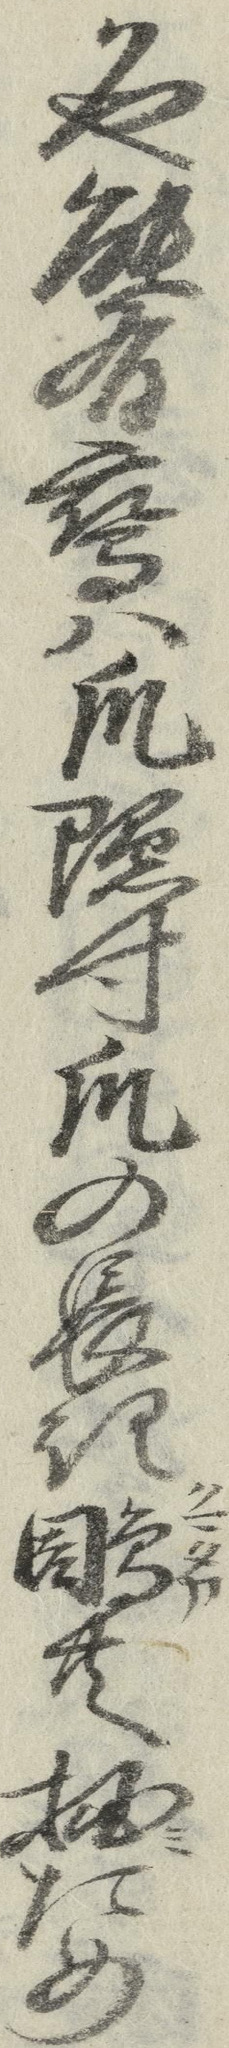かや能有鷹は爪隠す爪の長き鵰共掴みため
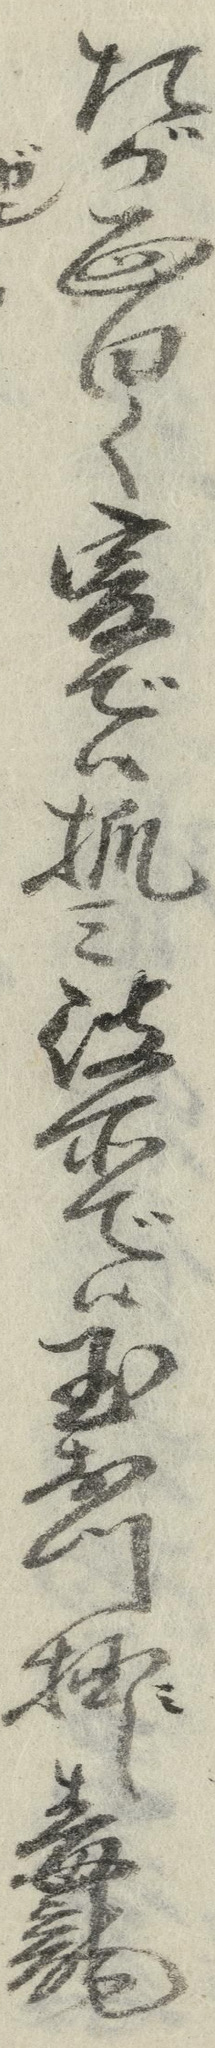たが面白く爰では抓み彼所では玉なつ掴みし毒龍
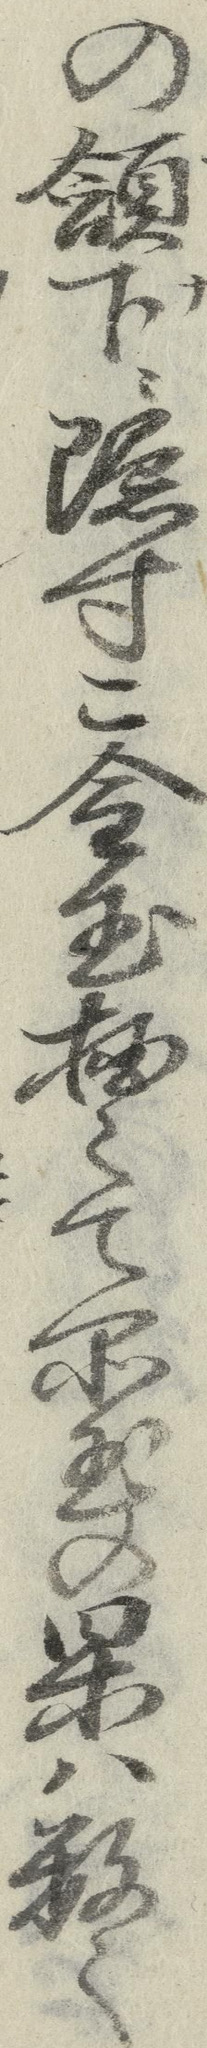の頷下に隠すニ金玉抽々て品玉の果は数々
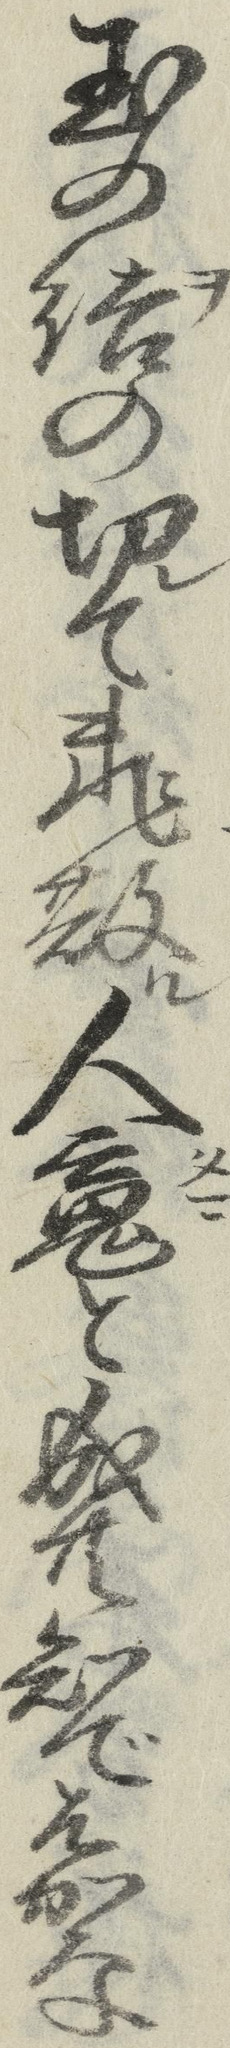玉の結の切飛散人魂と成共知ではかな
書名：浅間大焼騒動記　下
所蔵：東京大学地震研究所図書室 Earthquake Research Institute Library, The University of Tokyo, JAPAN
